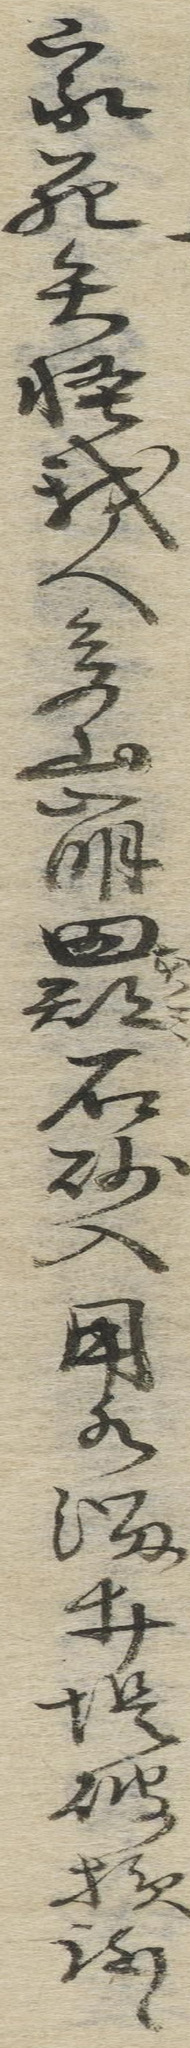家死失怪我人多山崩田畑石砂入用水温井堤破損致し

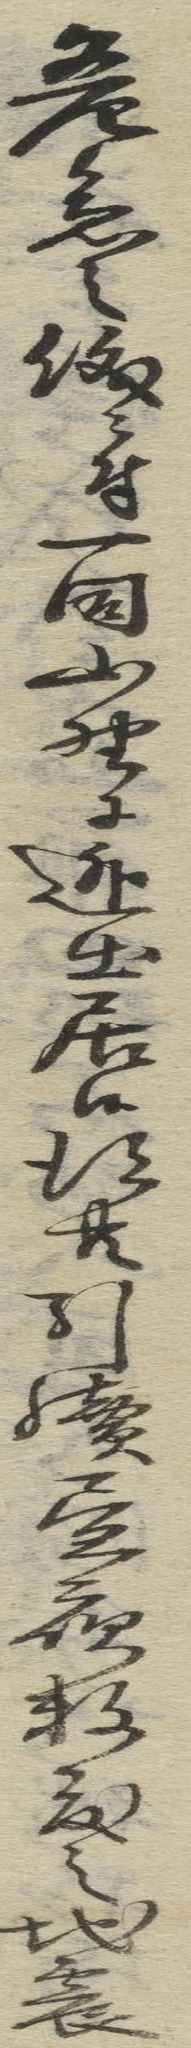危急の儀二付一同山野に逃出居候得共引続昼夜数度之地震
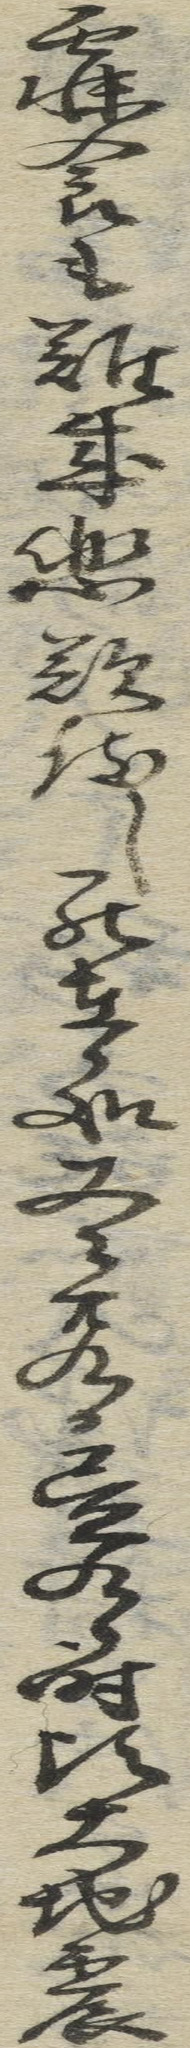寝食も難成悲歎致し罷在候処又々廿九日昼九ッ時頃大地震
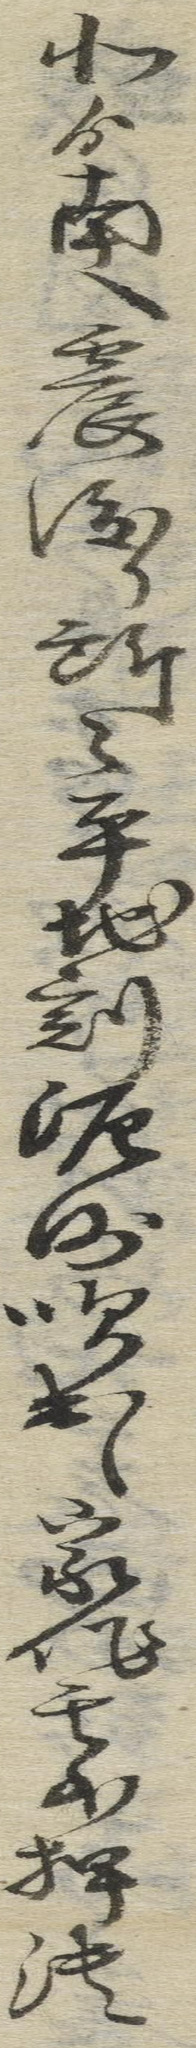北ゟ南へ震渡り所々平地割泥砂吹出し家作其外押潰
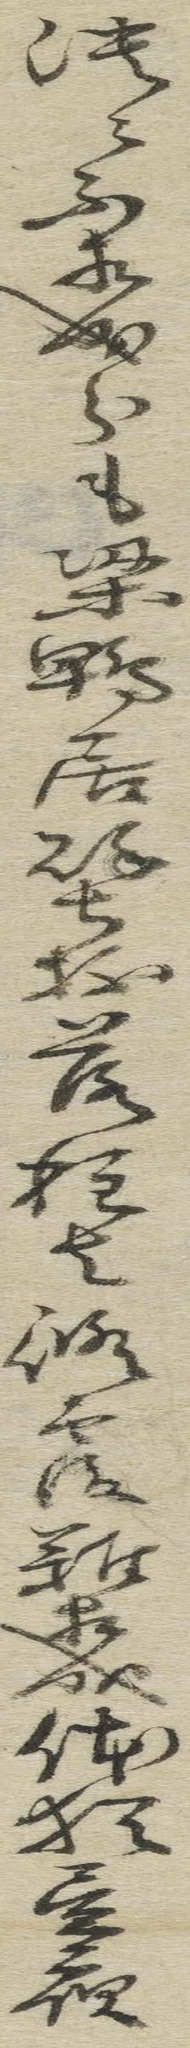潰二不相成分も梁鴨居壁抔振落柱は修復難相成体猶昼夜
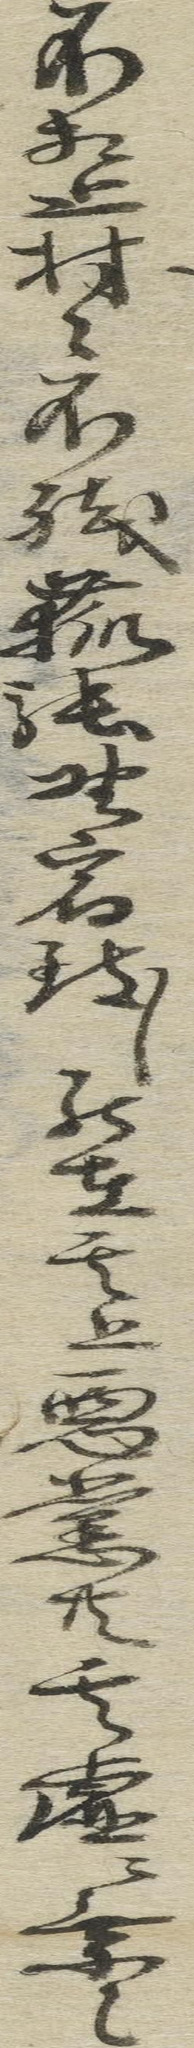不相止村々不残菰張野宿致し罷在其上悪党共其虚二乗し
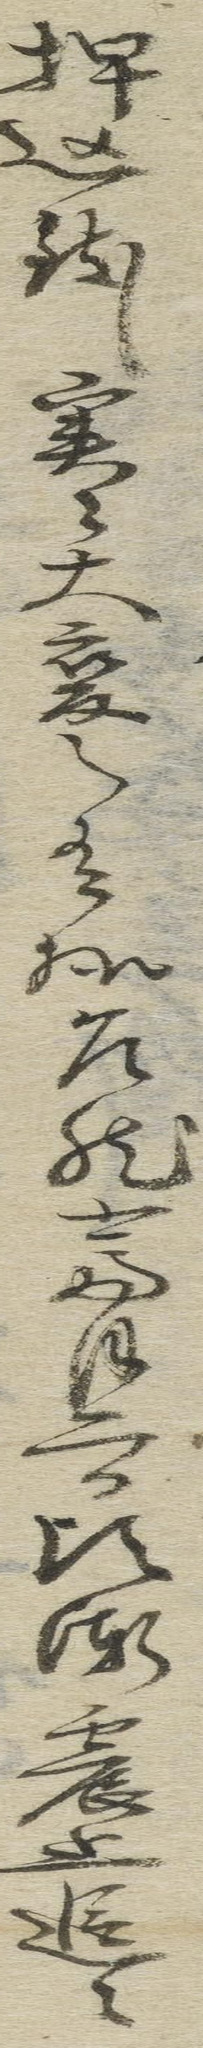押込致し実々大変之有様乍然当月二日頃漸震止追々
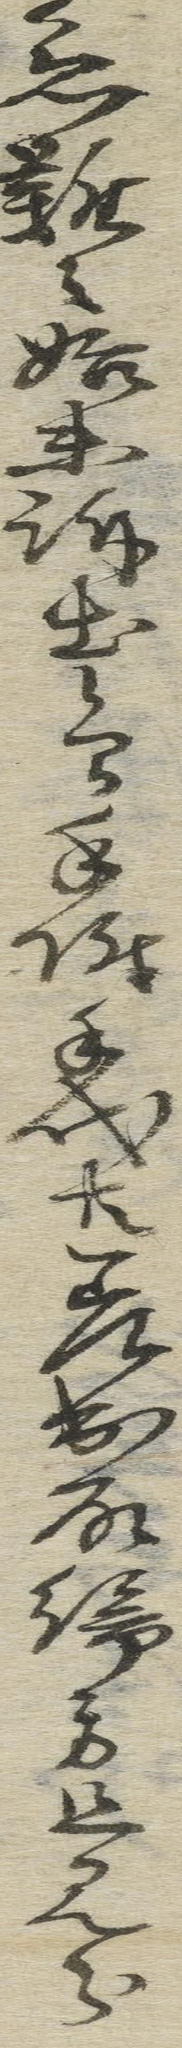急難之始末訴出候間手附手代共差出取締方且けん分
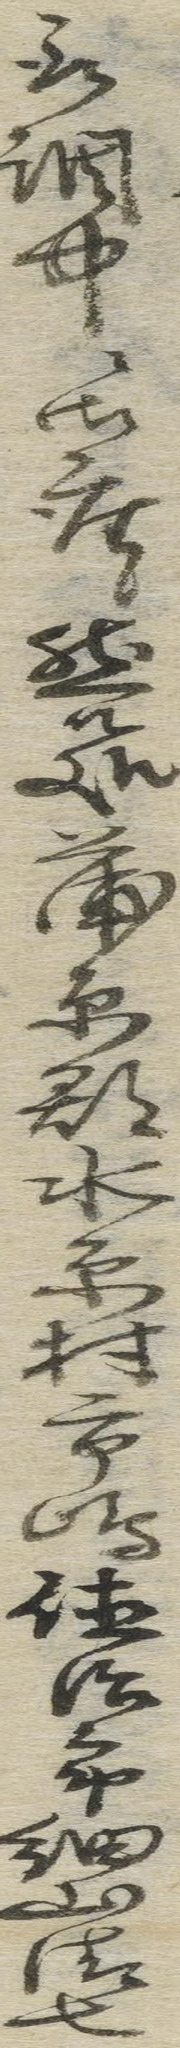取調中二御座候然ㇽ処蒲原郡水原村市崎徳治郎細山清七
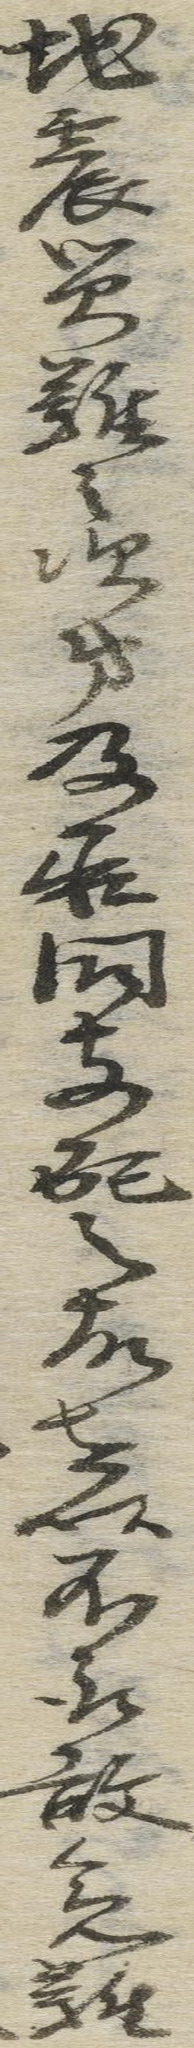地震災難之次第及承同支配所之故を以不取敢急難
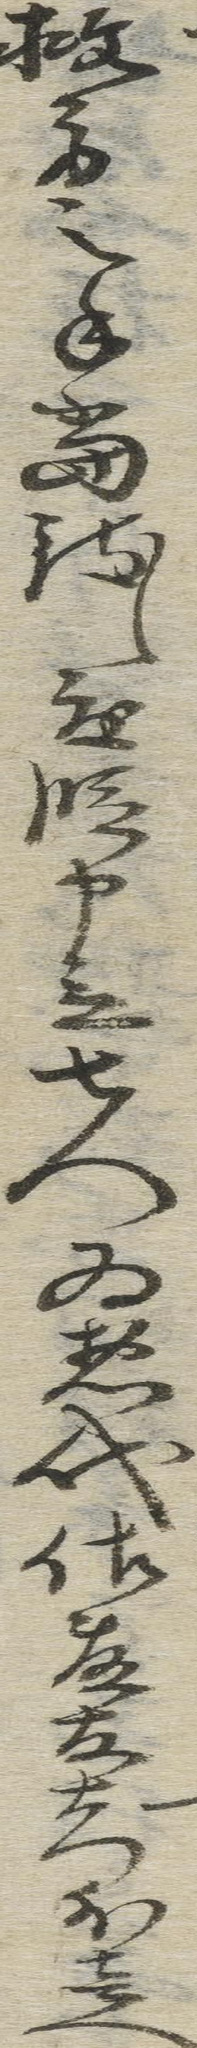救方之手当致し度段申立七人為惣代佐藤友右衛門外壱人
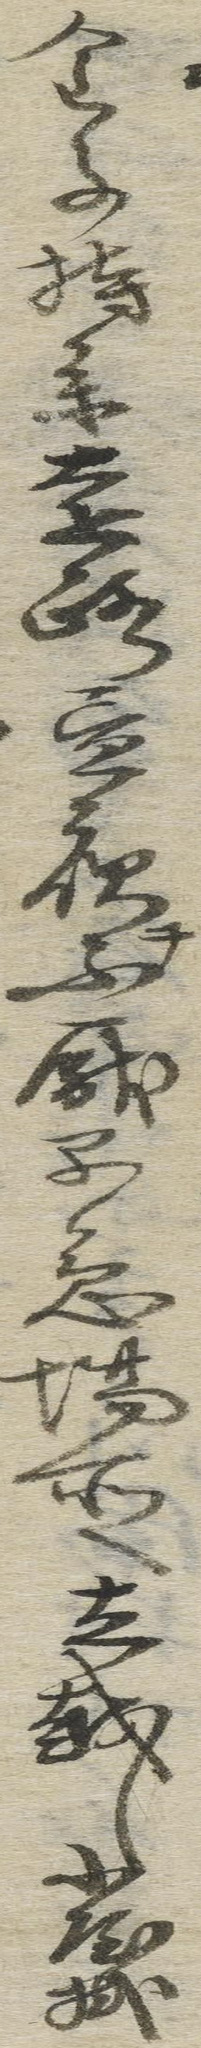今日持参遠路昼夜ヲ不厭早々急場所へ立越候小屋掛
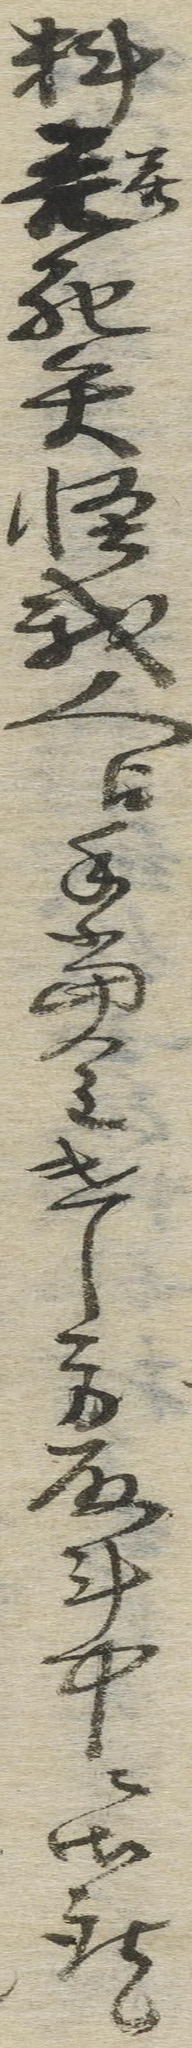料居死失怪我人江手当金遣し方取計中二御座候
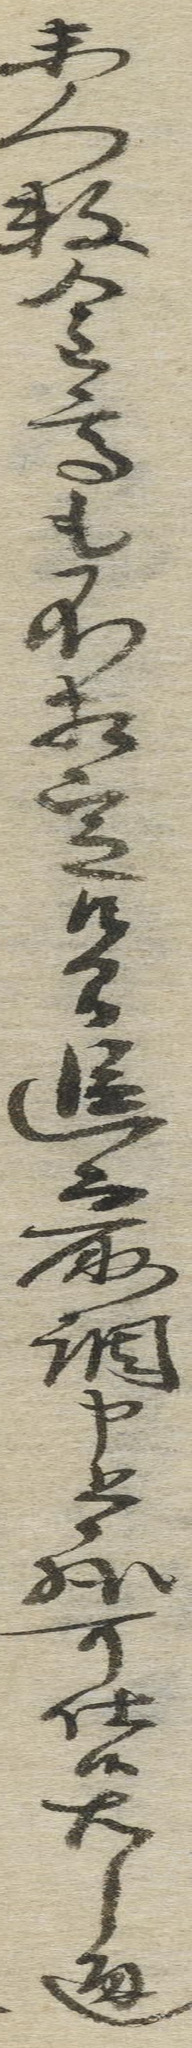未人数金高も不相定候間追而取調申上候様可仕候右之通
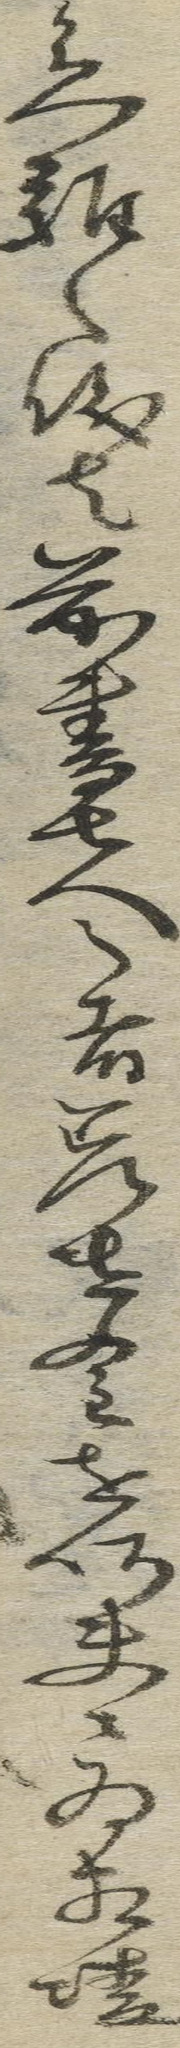急難之儀は前書七人之者差出金を以夫々為相堪
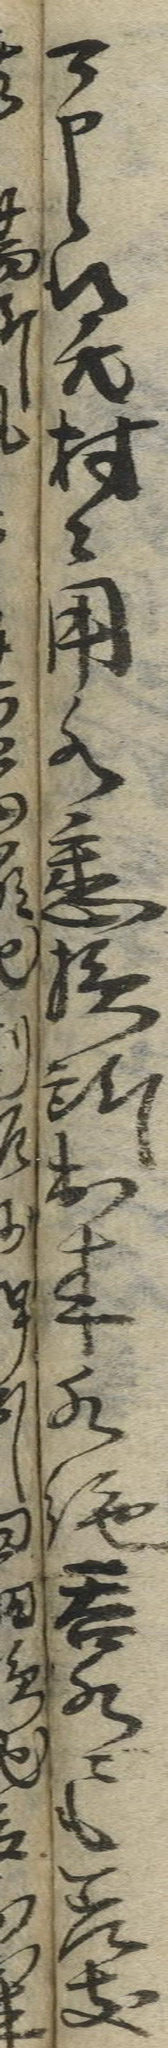可申候得共村々用水悉損所出来水絶呑水二も差支
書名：信濃越後　地震書留
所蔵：東京大学地震研究所図書室 Earthquake Research Institute Library, The University of Tokyo, JAPAN
